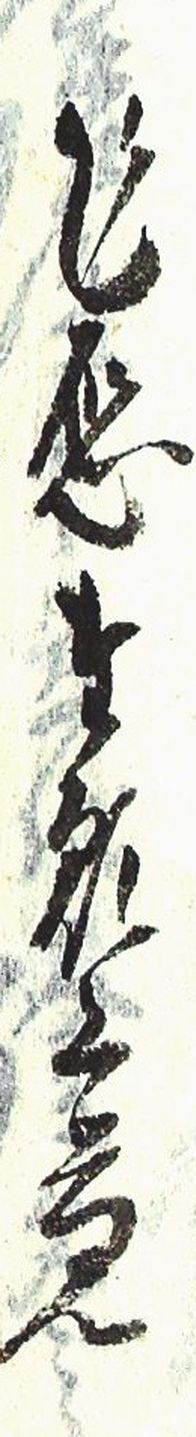乍恐奉願上覚
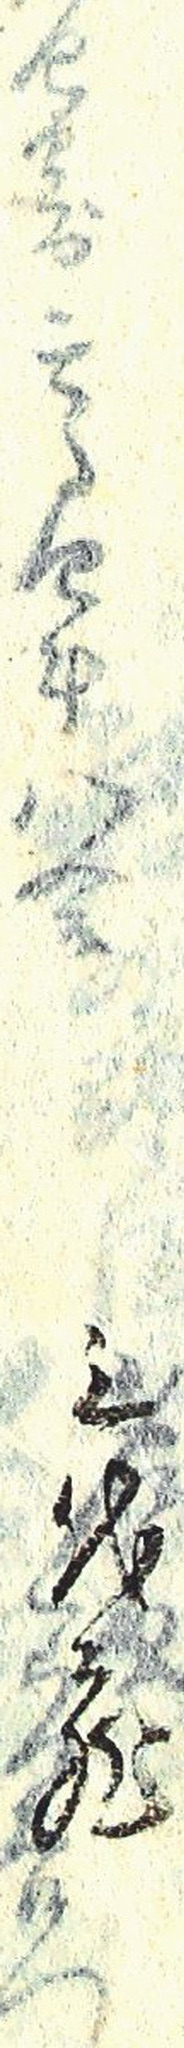三代蔵
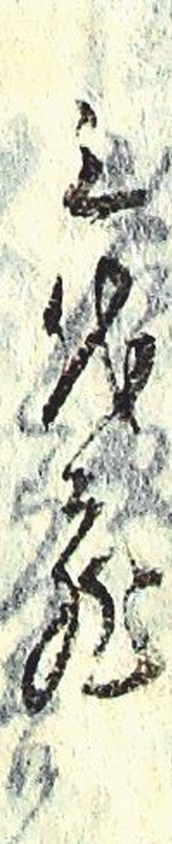三代蔵
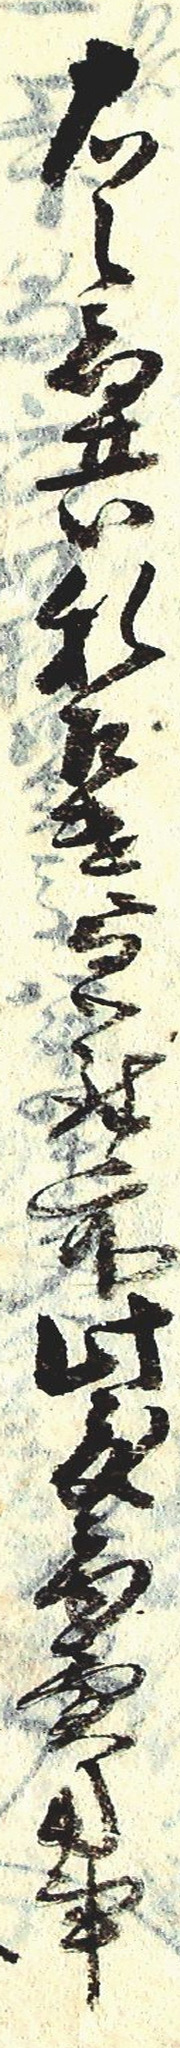右之者共私召遣にて御座候所此度商売用事
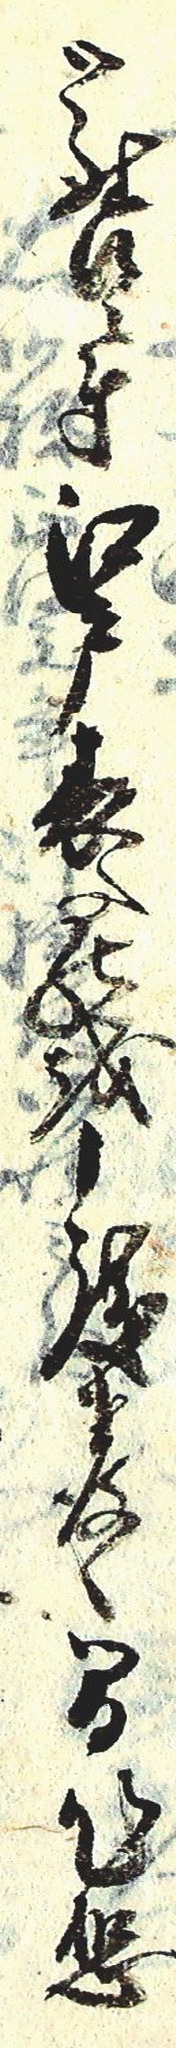御座候に付江戸表へ罷越申度奉存候間乍恐
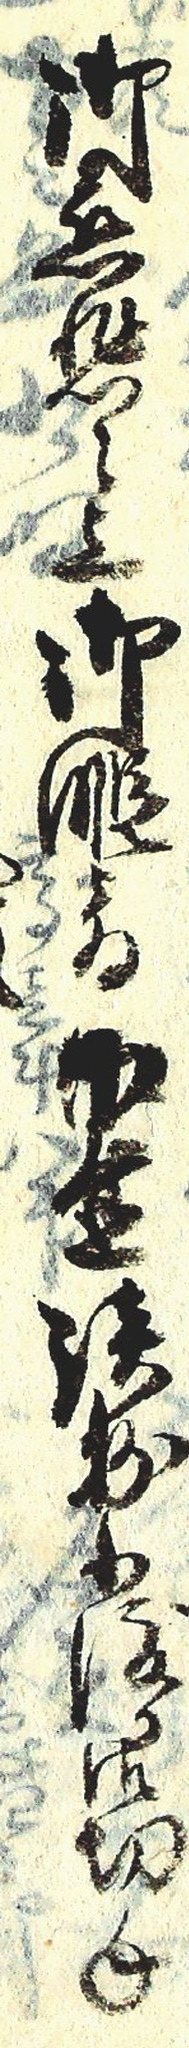御慈悲之上御暇被為下置淡州小渡り御切手
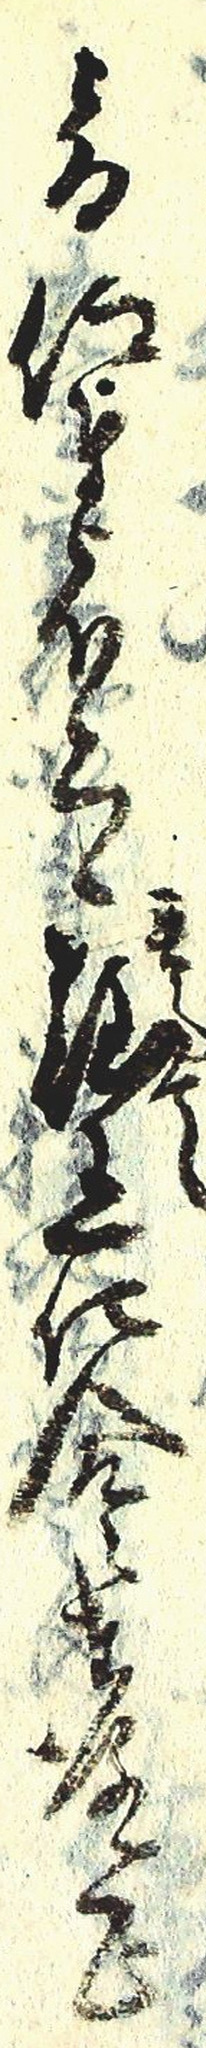被為仰付被下候はゝ重畳難有仕合に奉存候以上
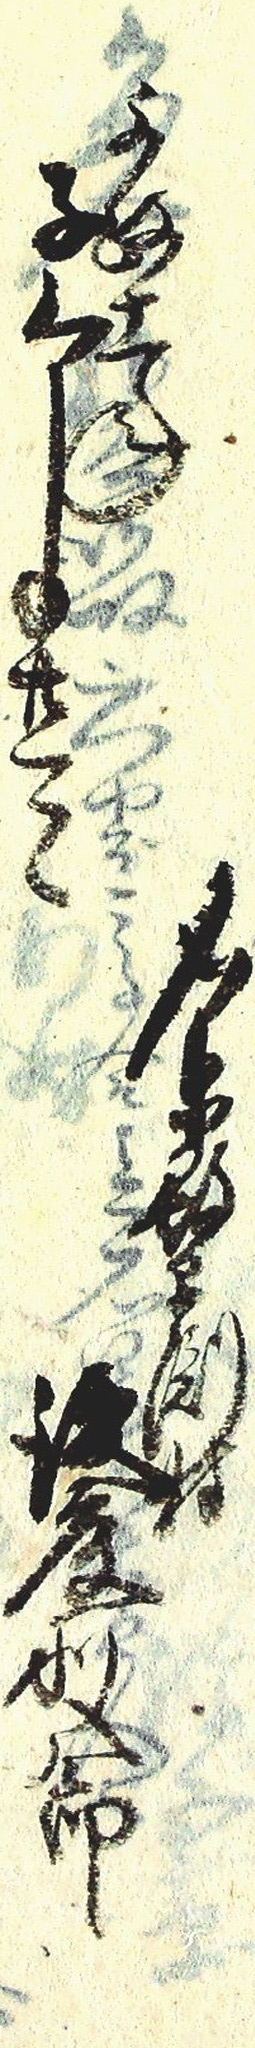子三月廿二日後藤利八郎
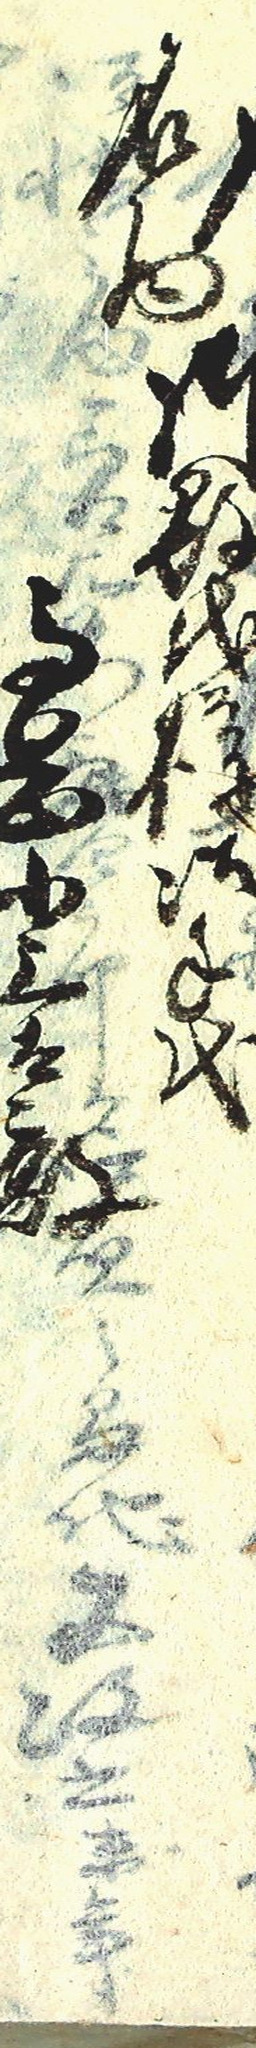高岡小三太殿
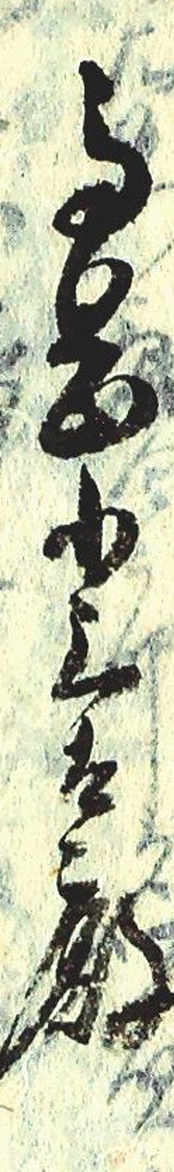高岡小三太殿
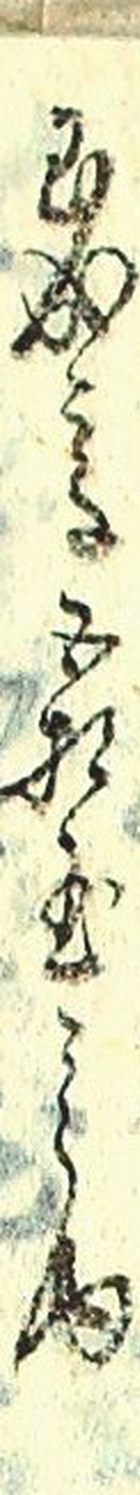玉成高五拾玉之内
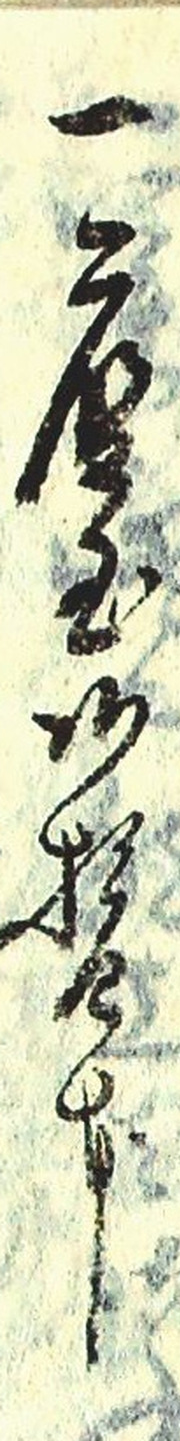一藍玉弐拾四本
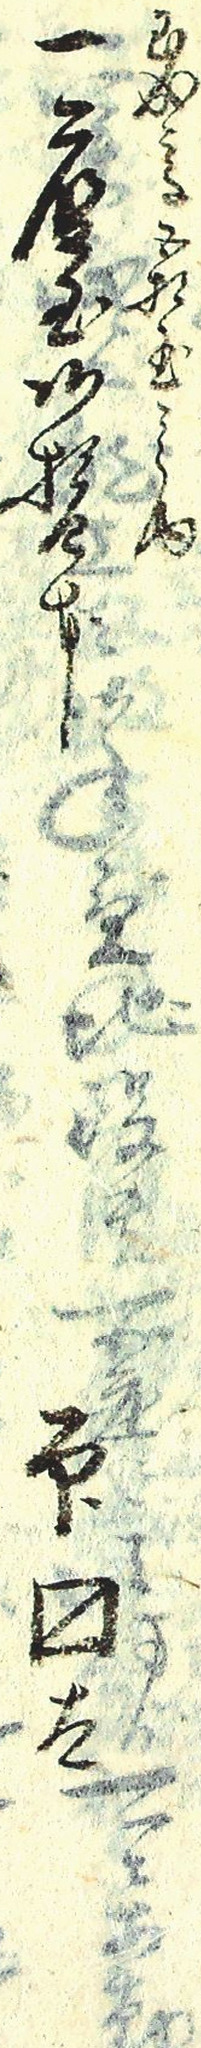一藍玉弐拾四本
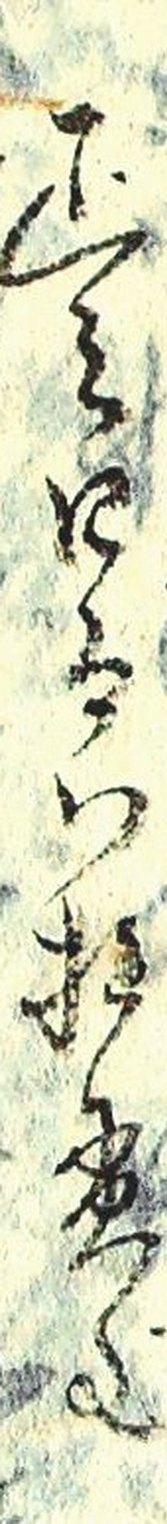正み四百八拾貫匁
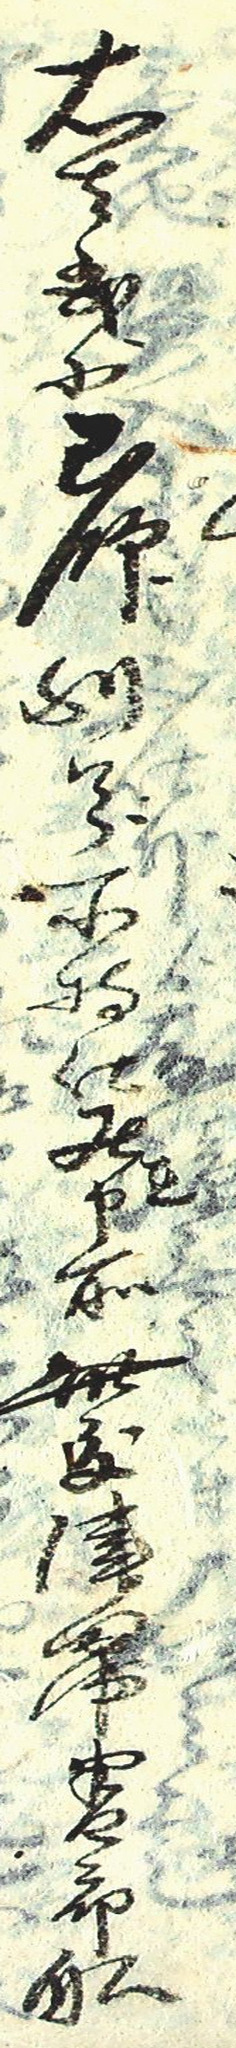右は当村玉師利八郎所持仕居在申所此度津田浦半次郎船
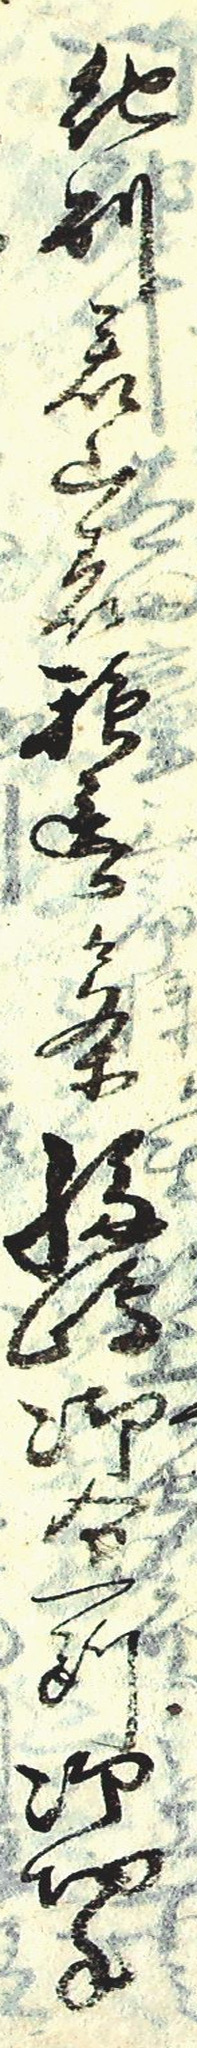紀州若山表積送り候条福島御分一所御切手
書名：諸御願書控(弐番）
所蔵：鳴門教育大学 Naruto University of Education
